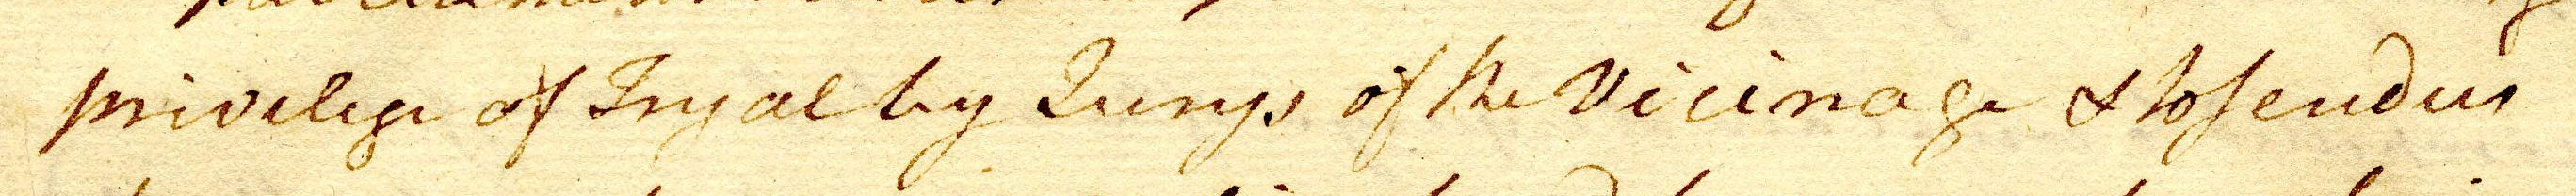privelege of Tryal by Jurys of the Vicinage & to send us
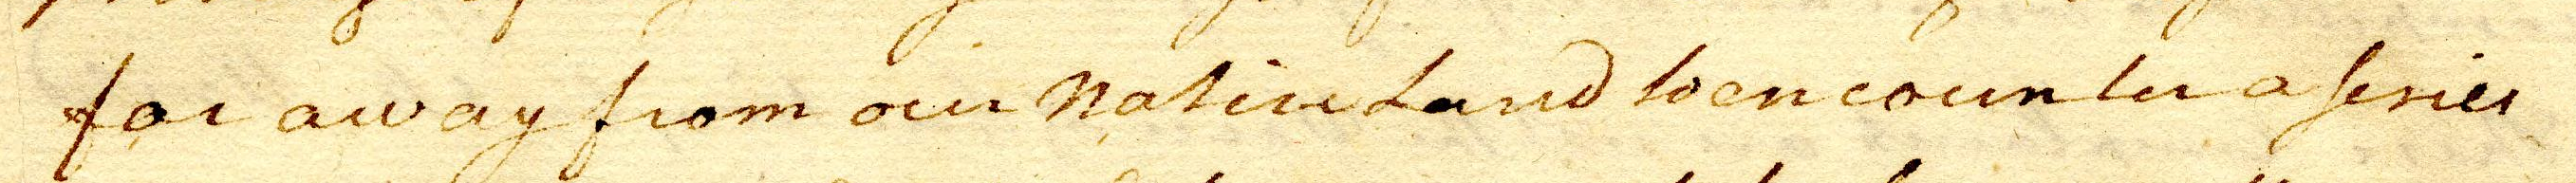far away from our Native Land to encounter a series
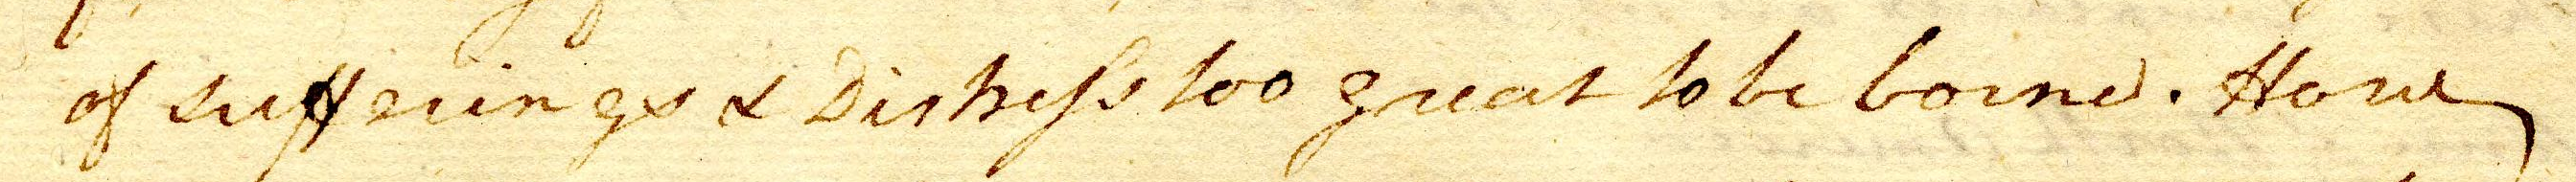of Sufferings & Distress too great to be borne. How
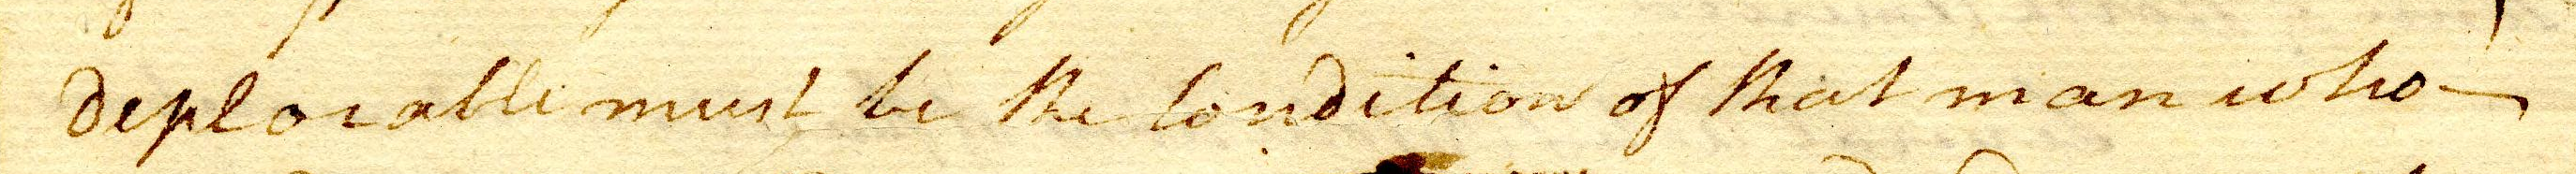deplorable must be the Condition of that man who-
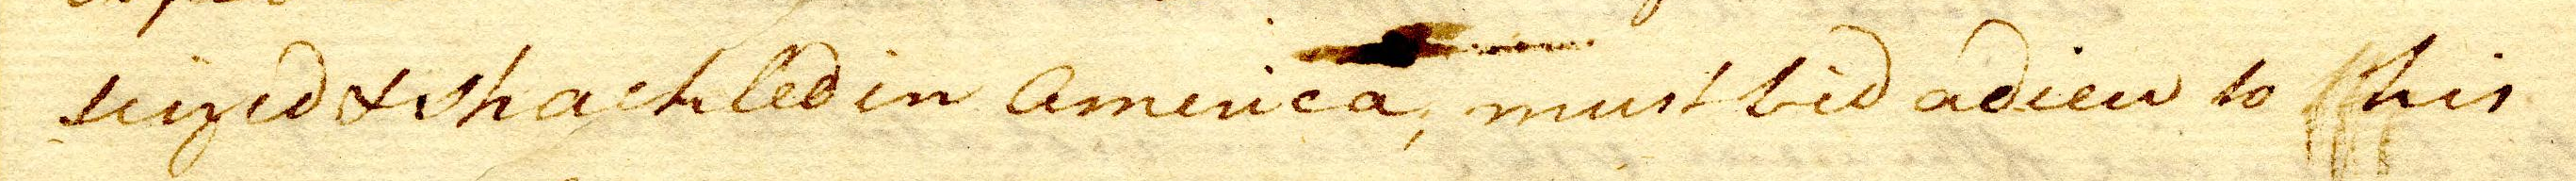seized & shackled in America, must bid adieu to this
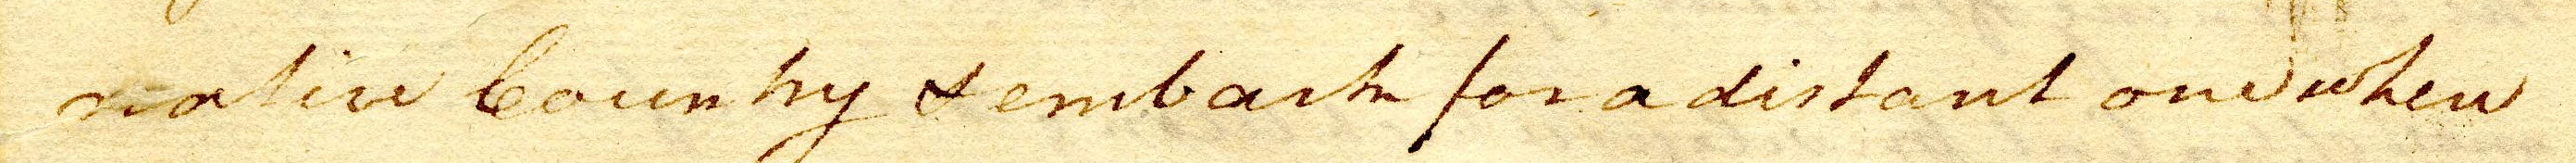native Country & embark for a distant one when
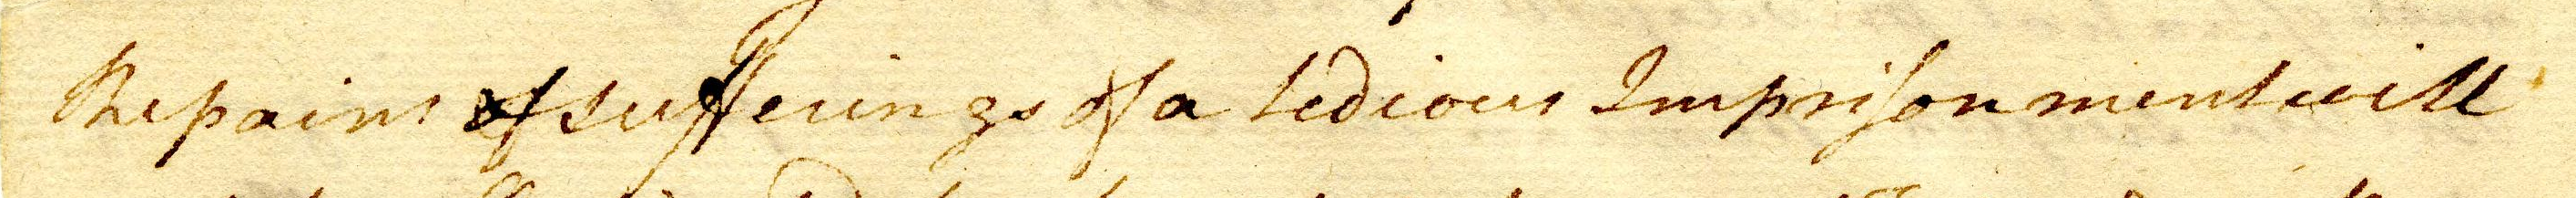the pains of Sufferings of a tedious Imprisonment will
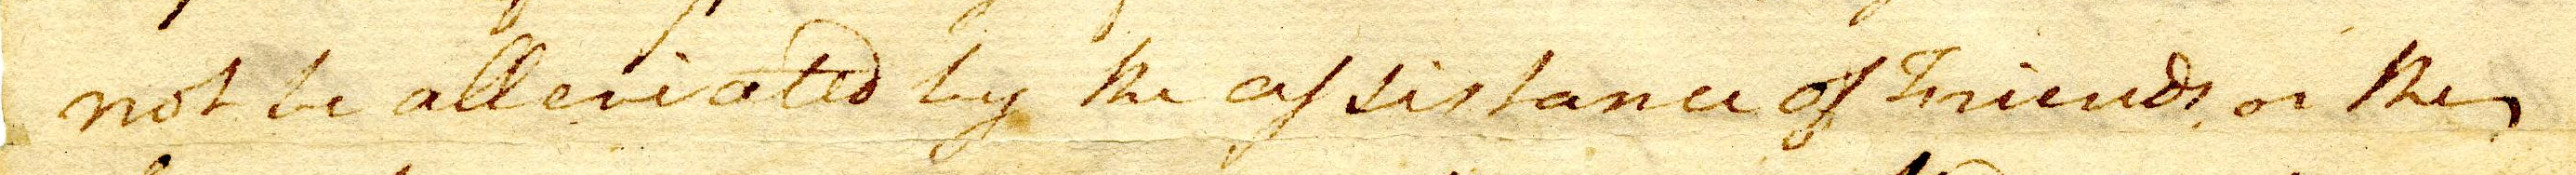not be all alleviated by the assistance of Friends or the
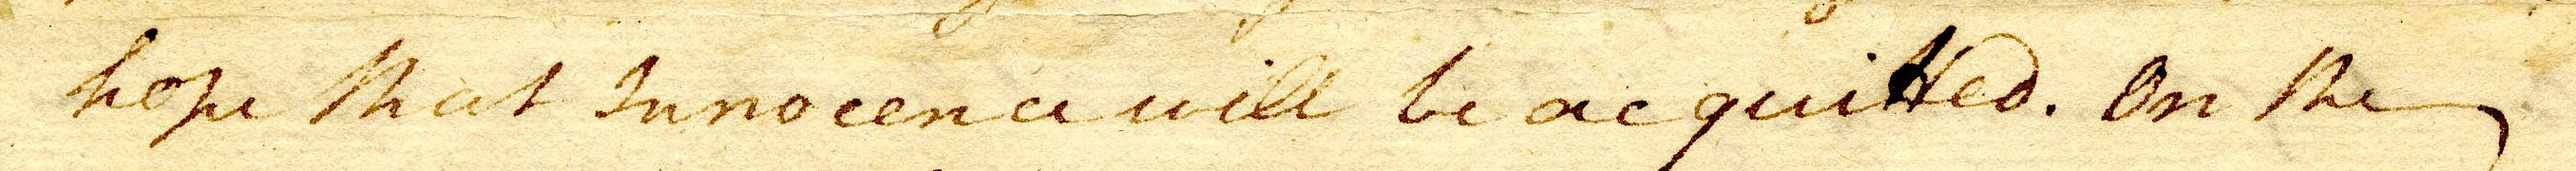hope that Innocence will be acquitted. On the
